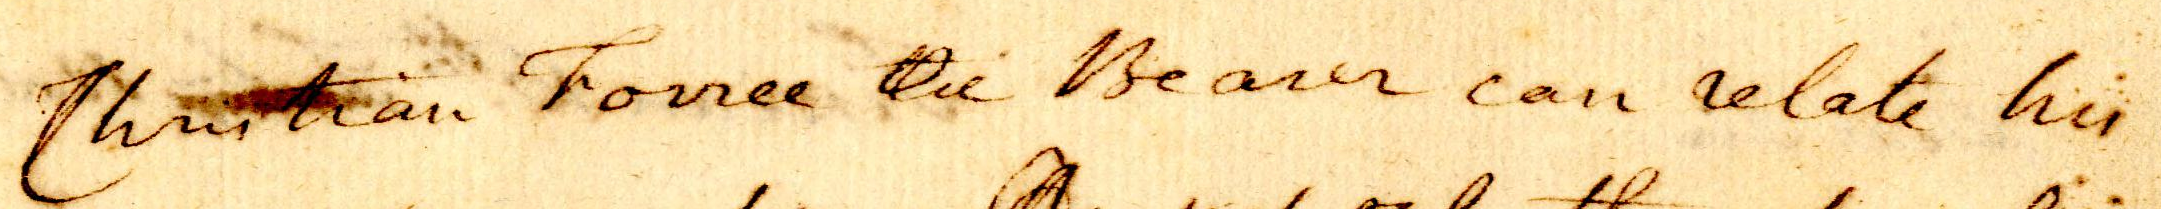Christian Foree the Bearer relate his
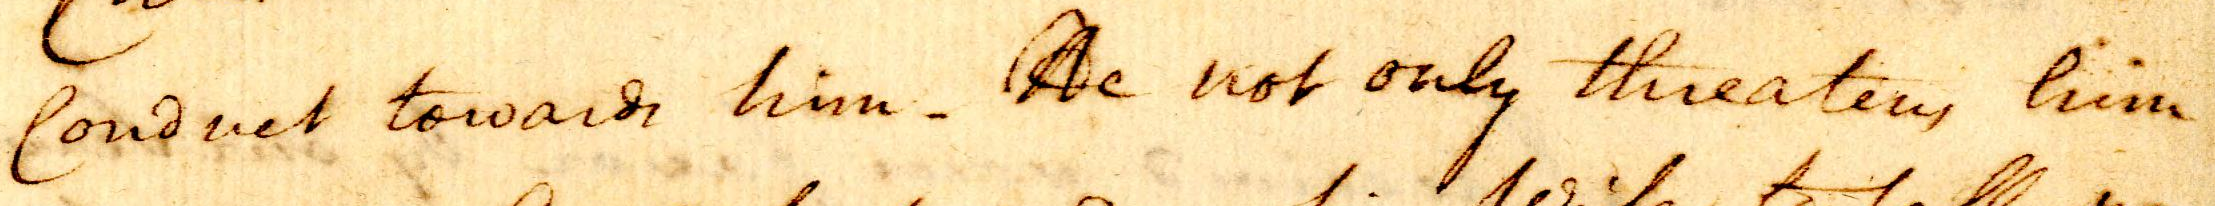Conduct towards him. He not only threatens him
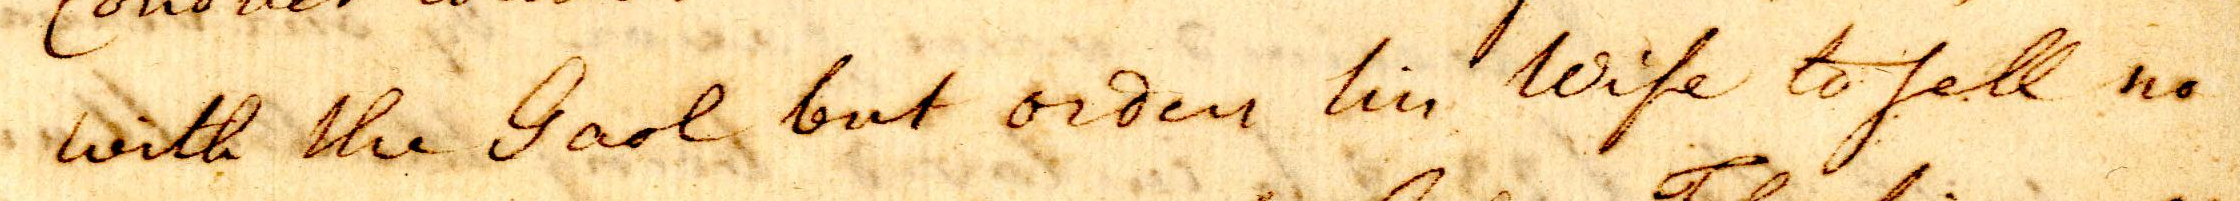with the Gaol but orders his Wife to sell no
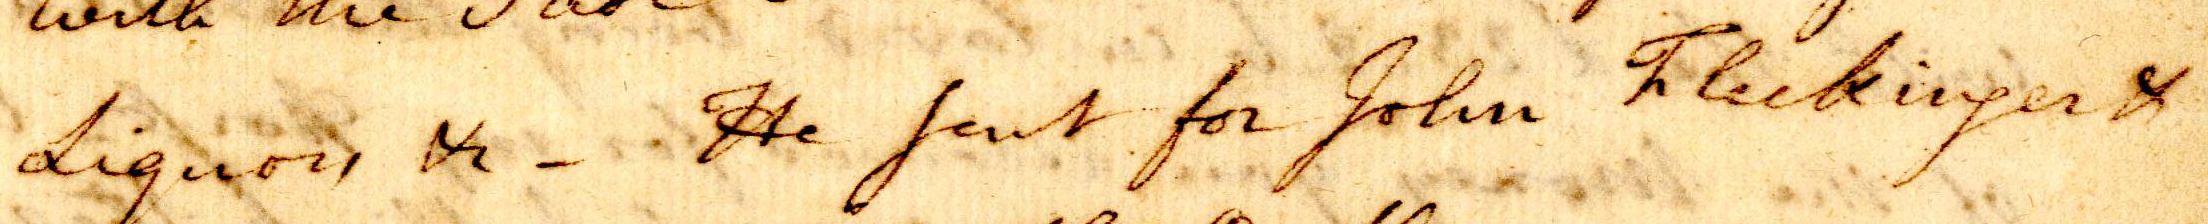Liquors &c- He sent for John Fleckinger &
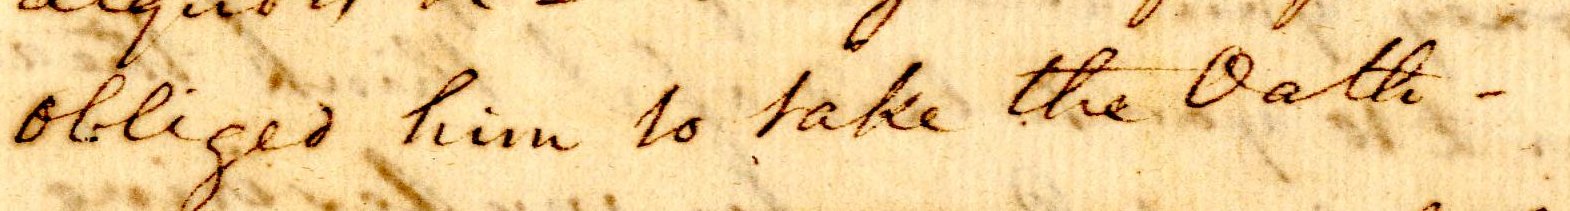obliged him to take the Oath-
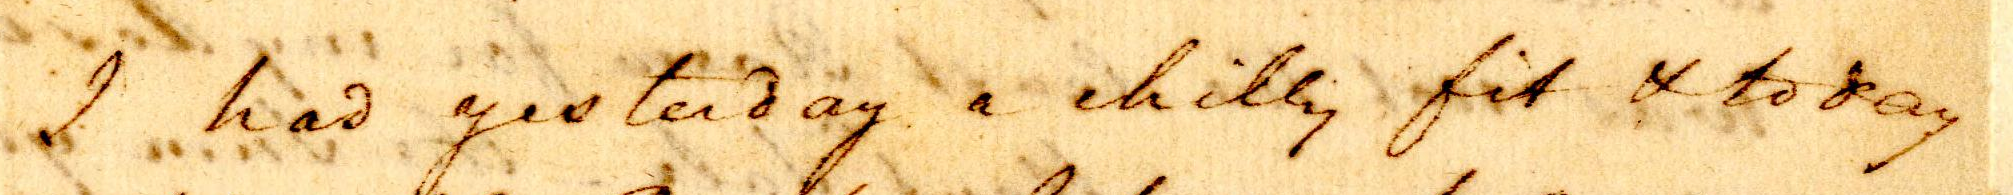I had yesterday a chilly fit & to day
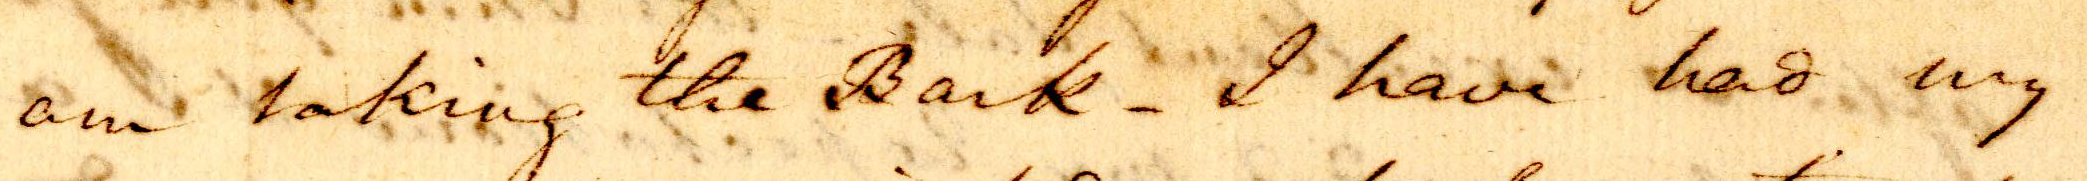am taking the Bark- I have had my
